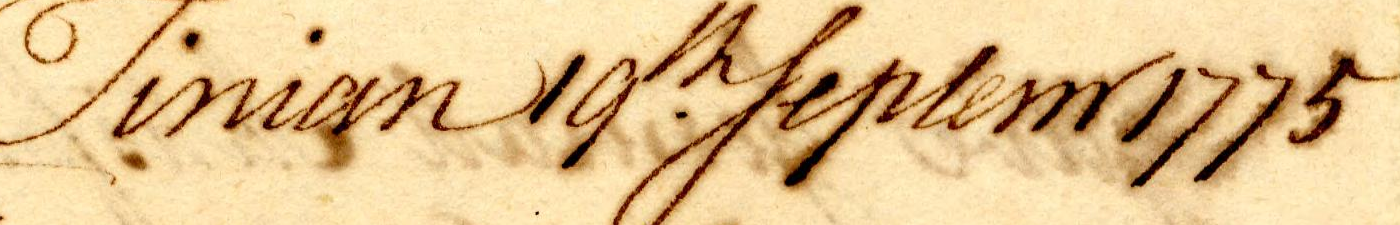Tinian 19^th. Septem^r 1775
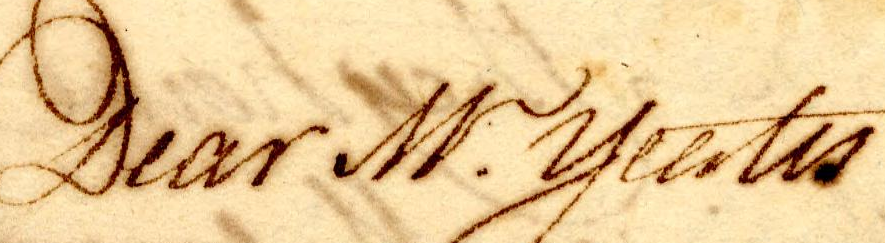Dear M^r. Yeates
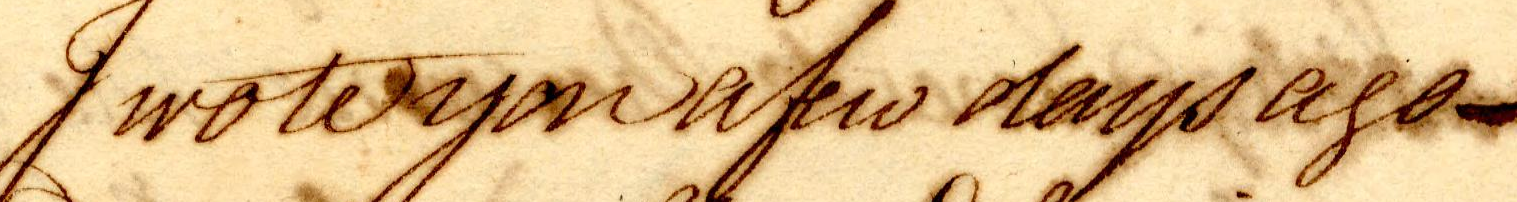I wote you a few days ago.
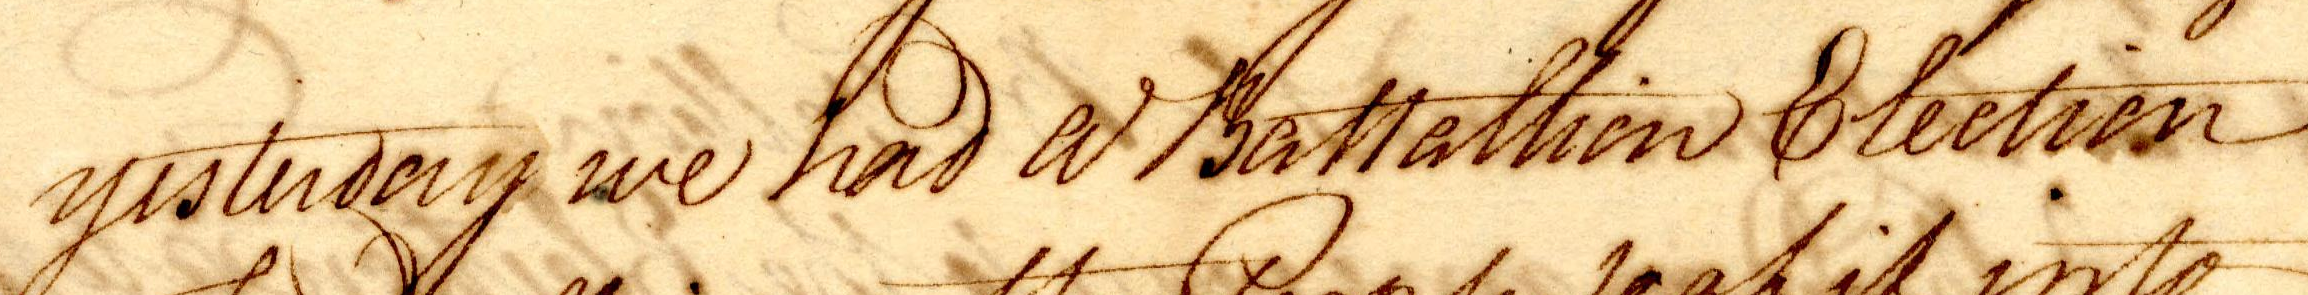yesterday we had a Battalion Election
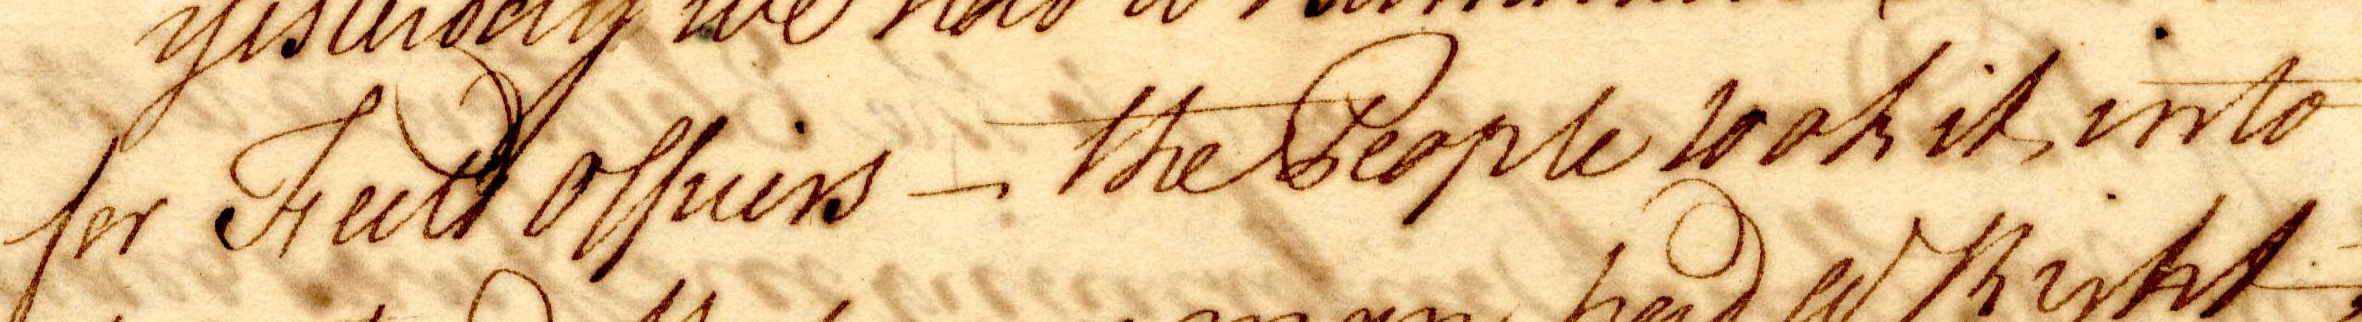for Field Officers. the People took it into
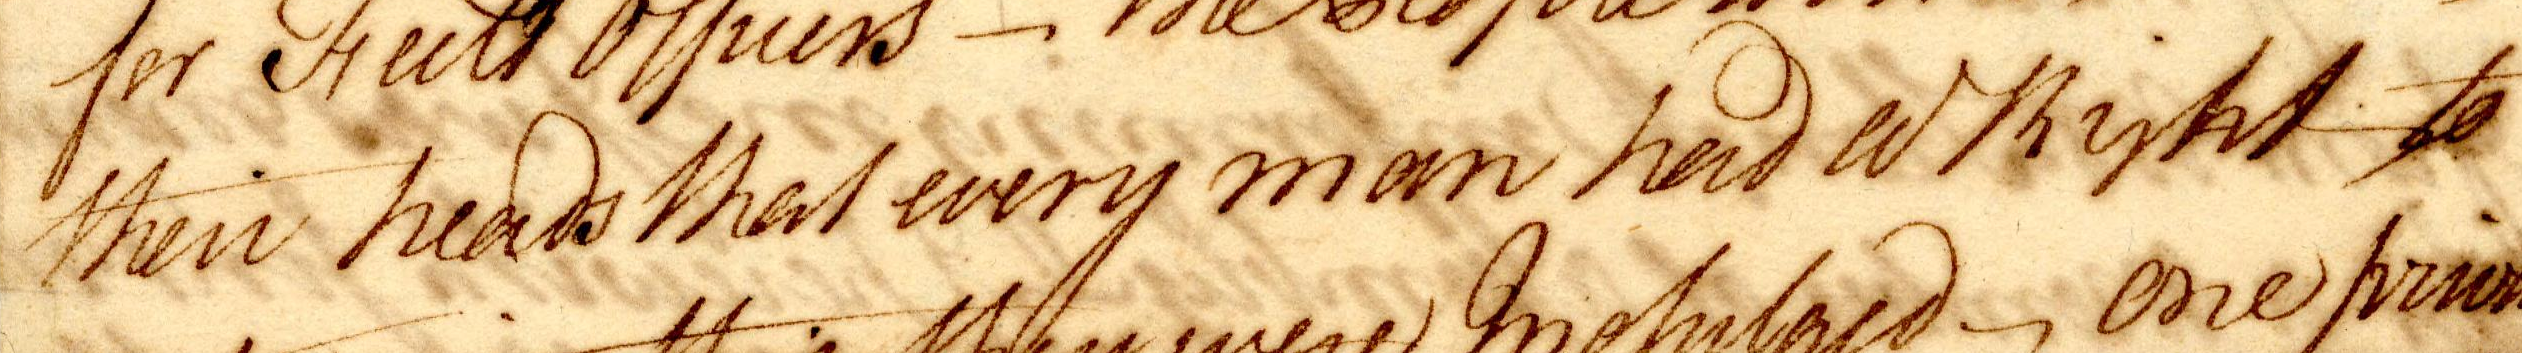their heads that every man had a Right to
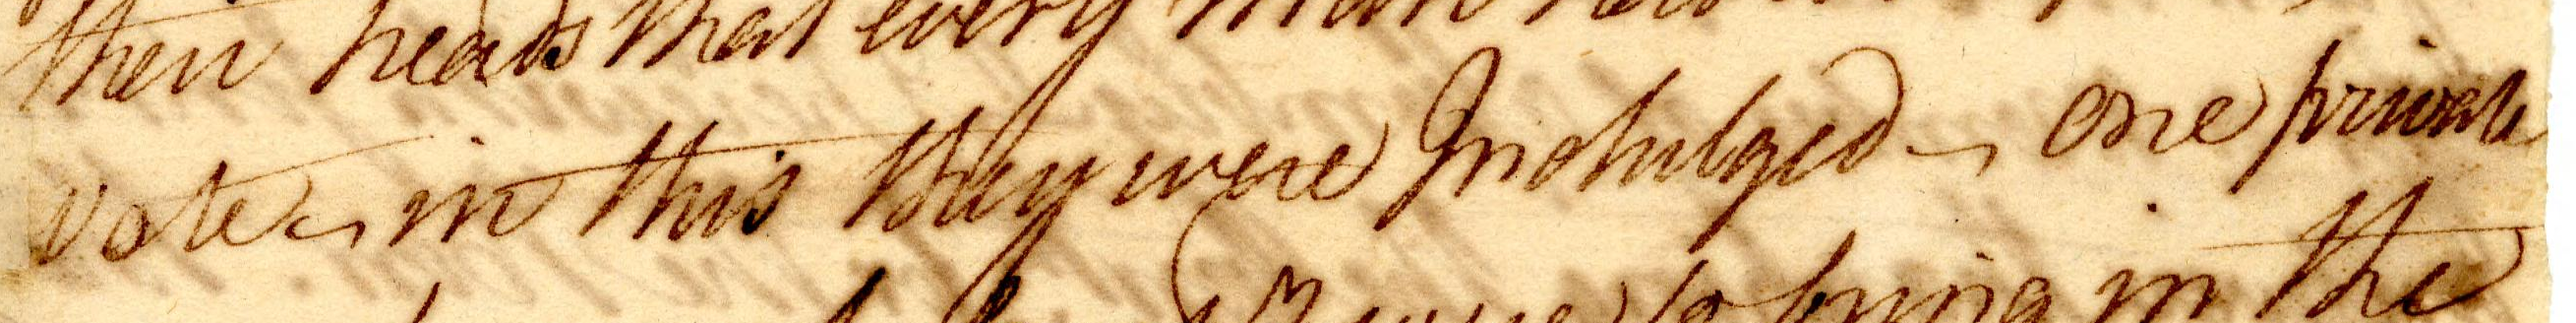vote. in this they were Indulged. one private
